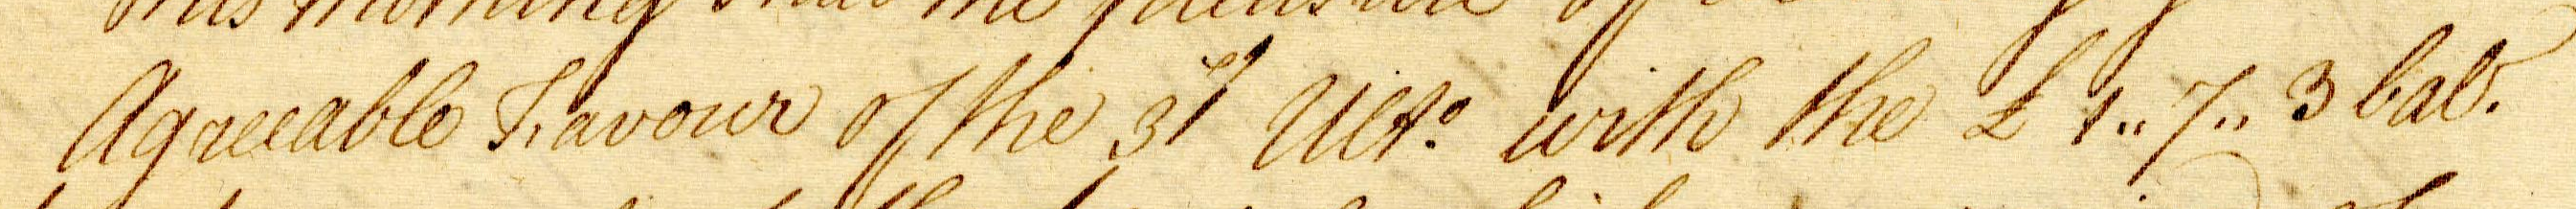Agreeable Favour of the 31^st Ult^o. with the £1..7.. 3 bal.
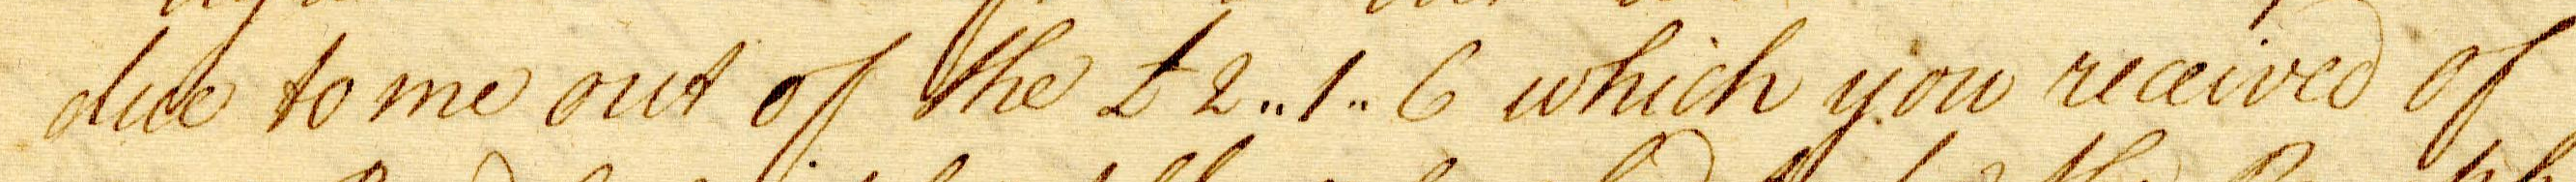did to me out of the £2..1..6 which you received of
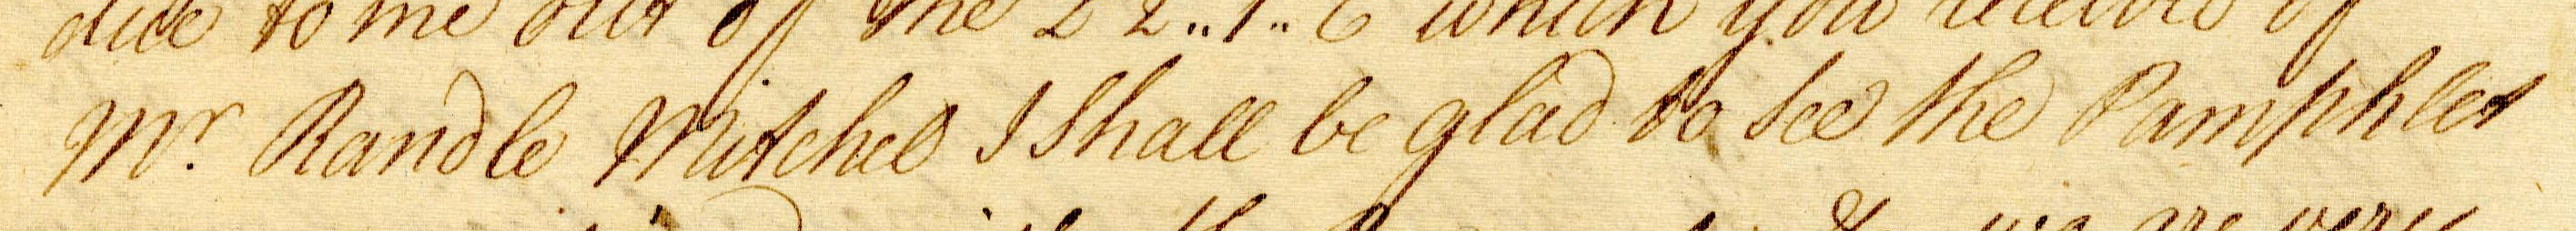M^r. Randle Mitchel I shall be glad to see the Pamphlet,
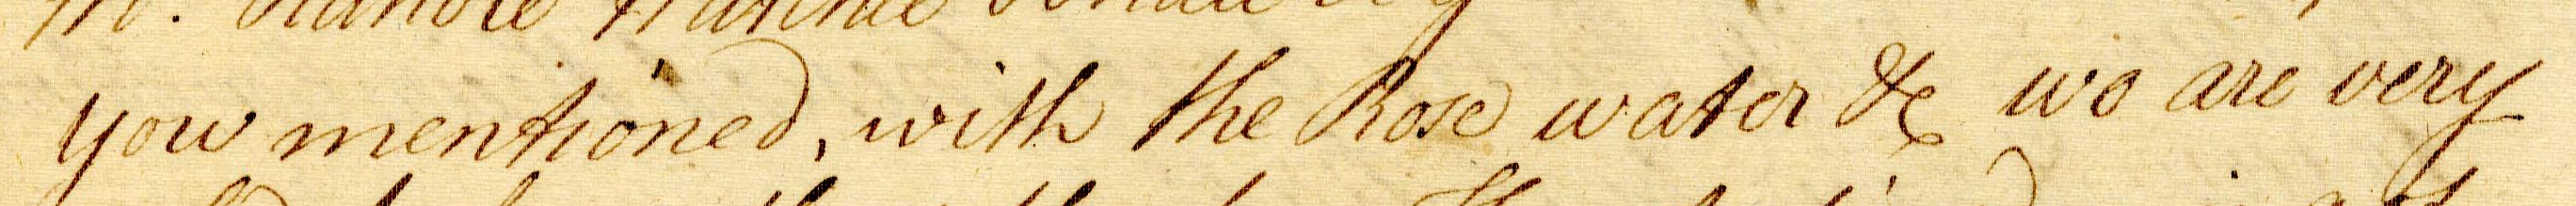you mentioned, with the Rose water &c we are very
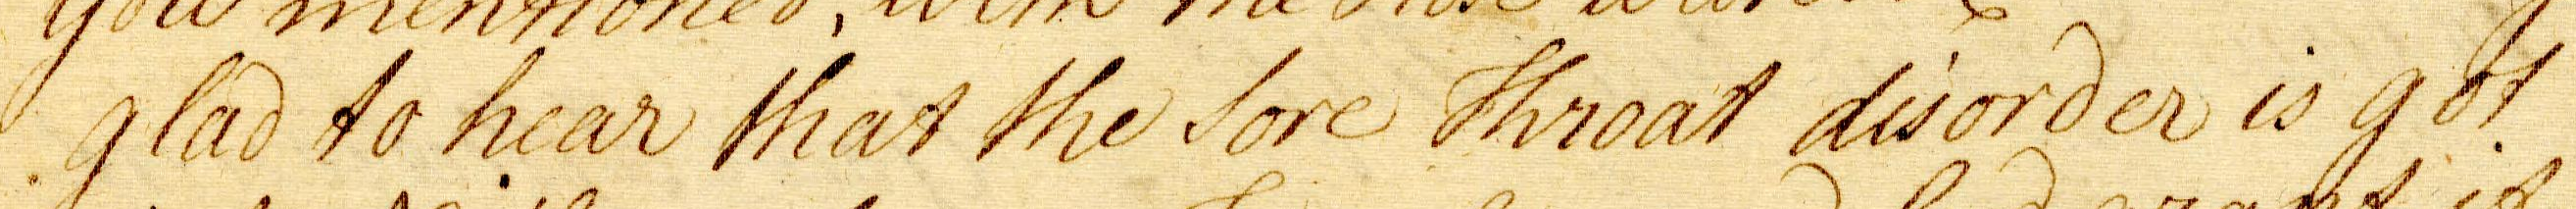glad to hear that the Sore Throat disorder is got
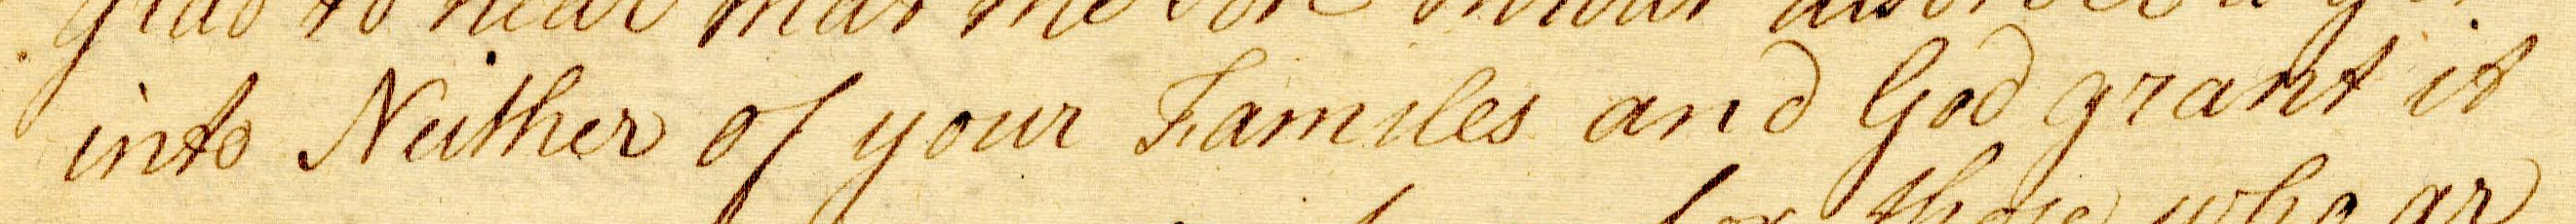into Neither of your Familes and God grant it
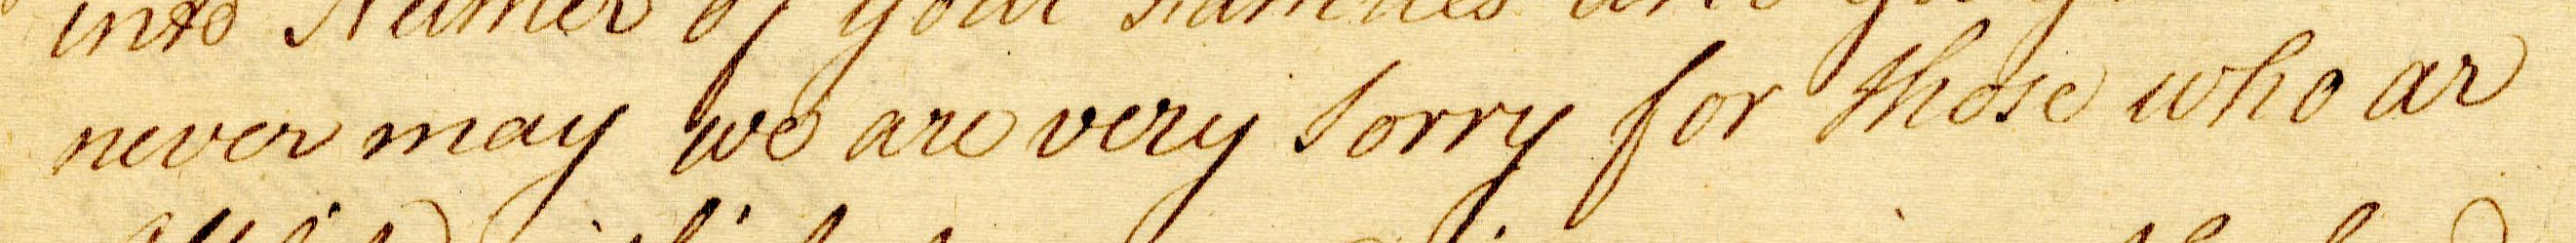never may we are very Sorry for those who ar
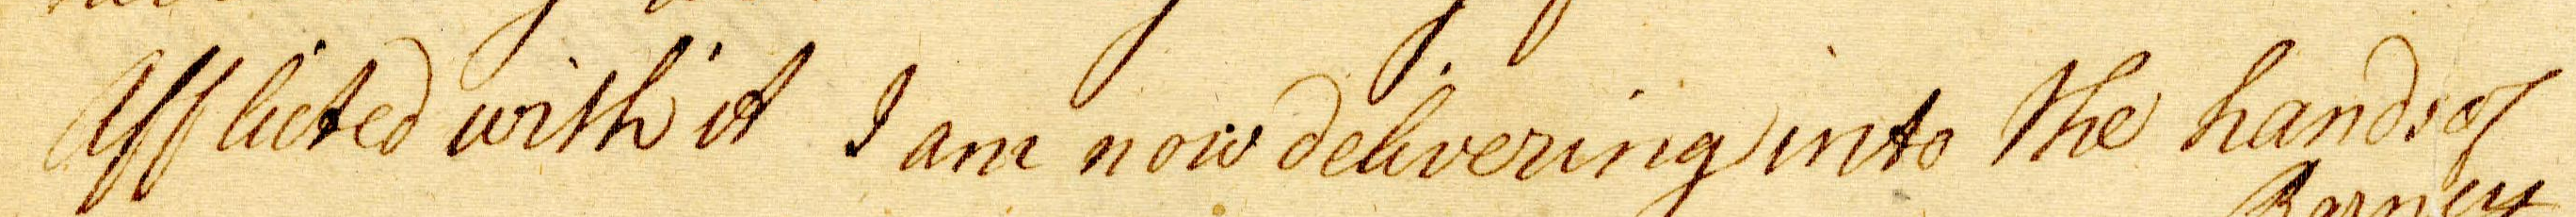Afflicted with it I am now delivering into the hands of
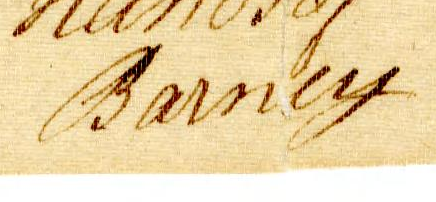Barney
